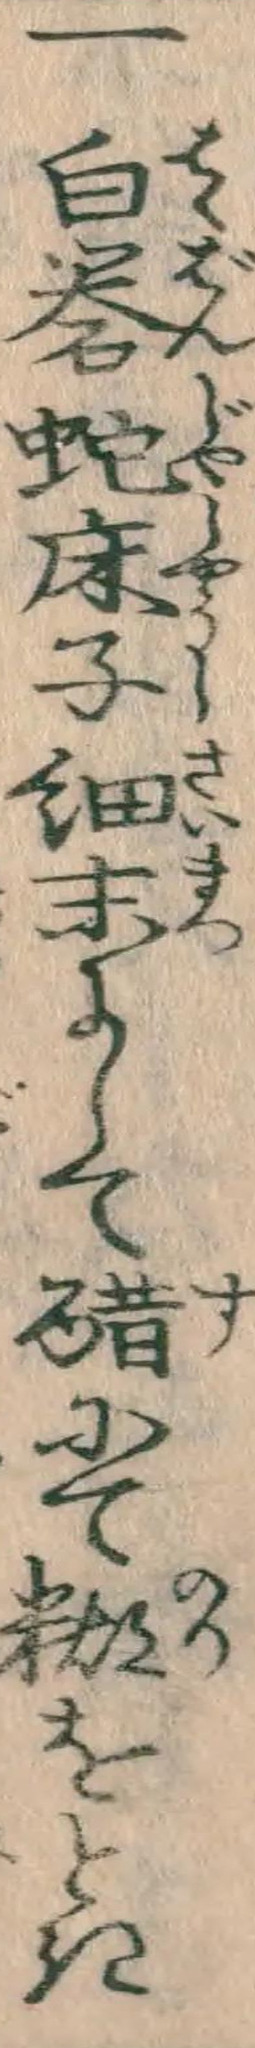一白碁蛇床子細末にして醋にて糊をとき
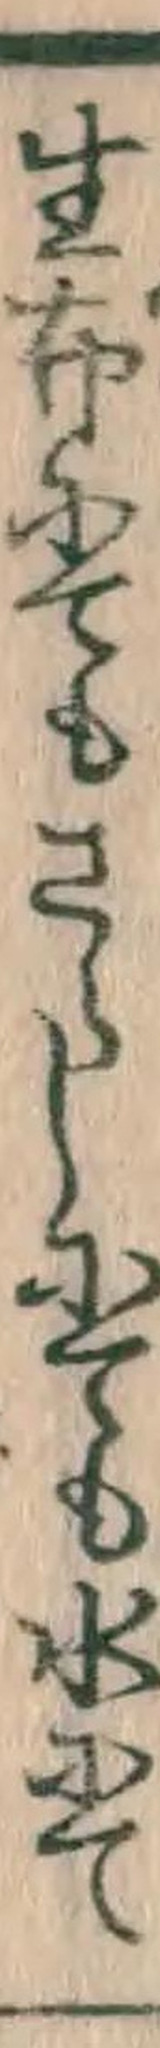生布にてもさらしにても水にて
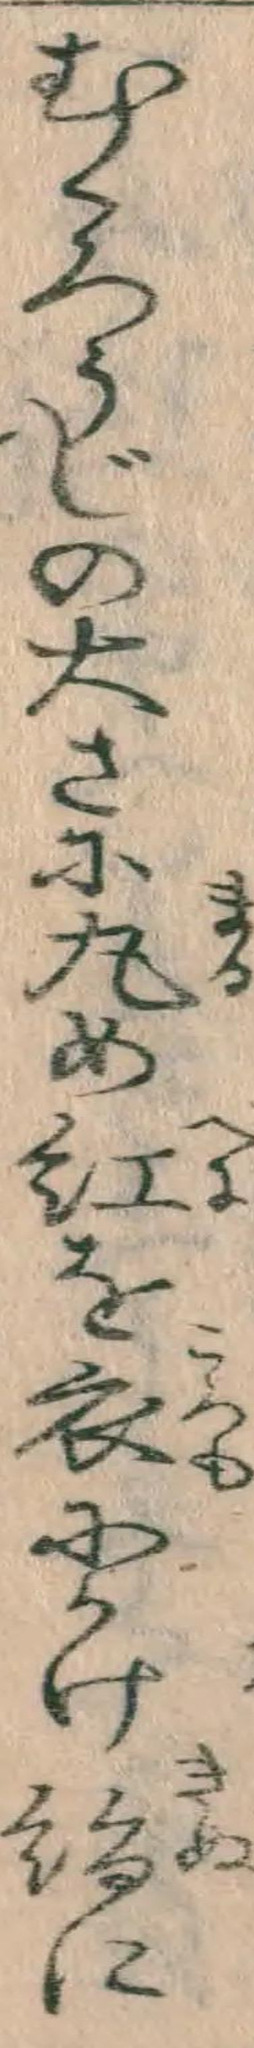むくろうじの大さに丸め紅を衣にかけ絹に
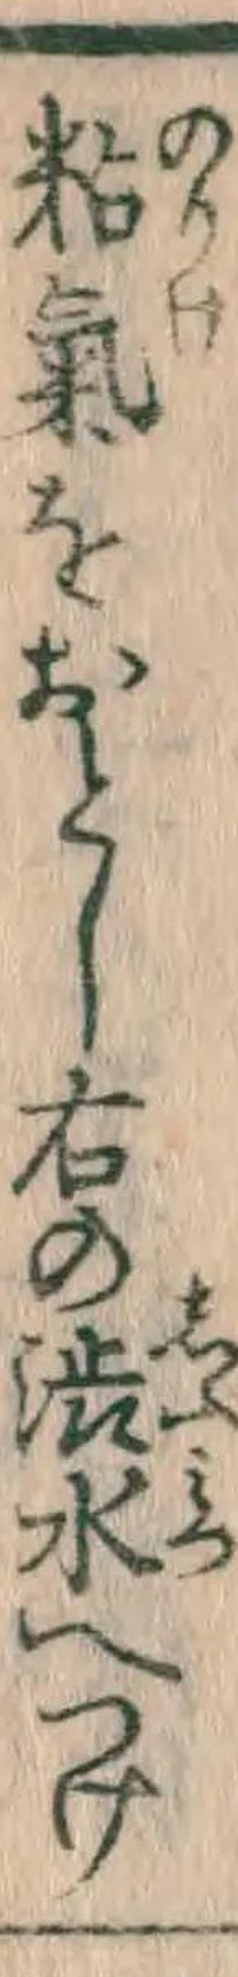粘気をおとし右の渋水へつけ
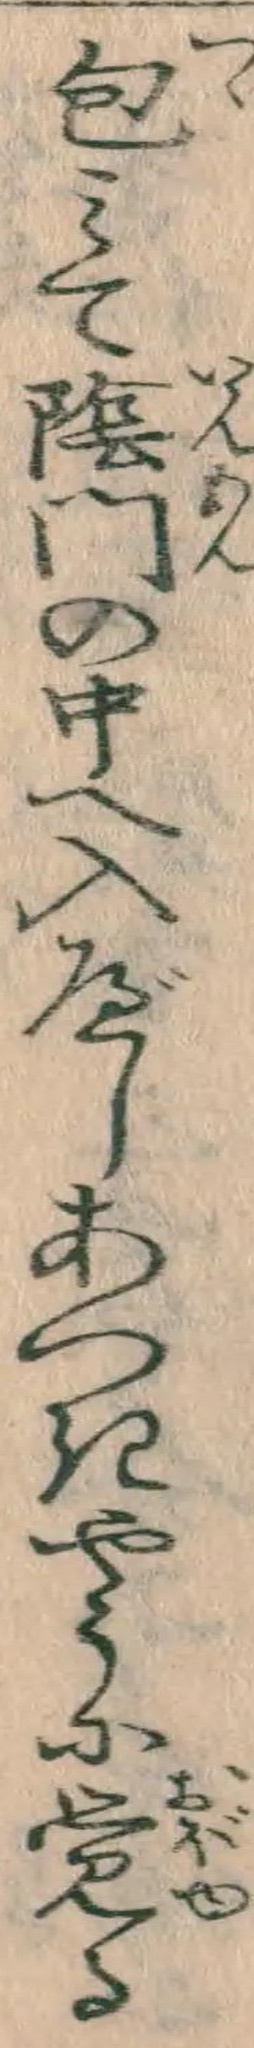包みて陰門の中へ入べしあつきやうに覚る
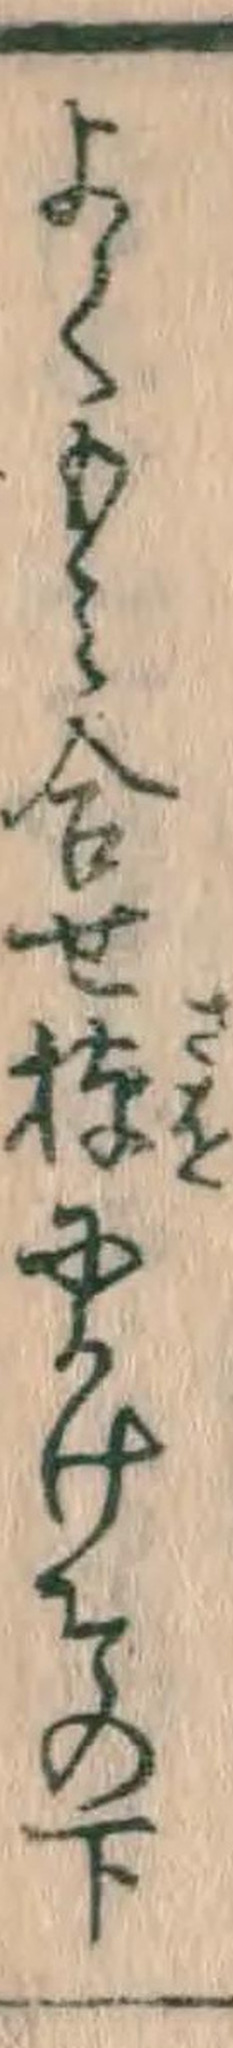よくもみ合せ棹にかけその下
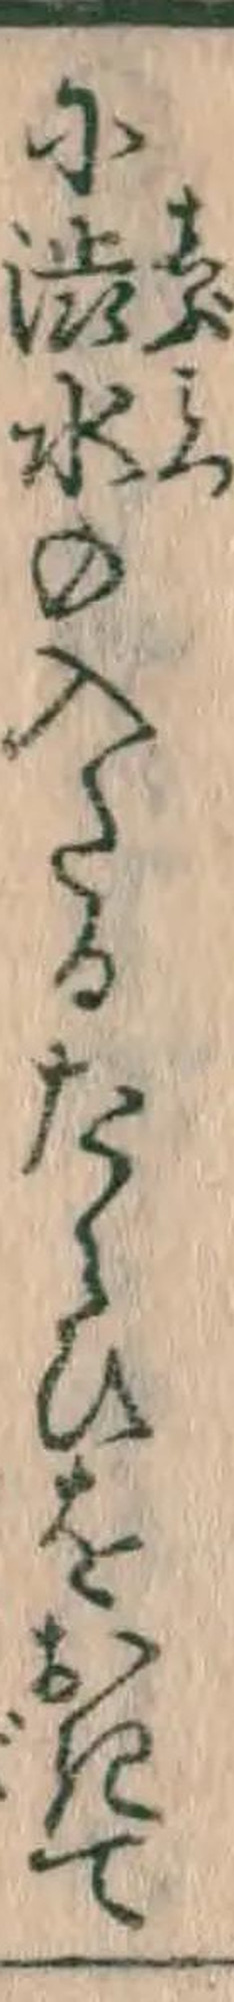に渋水の入たるたらひをおきて
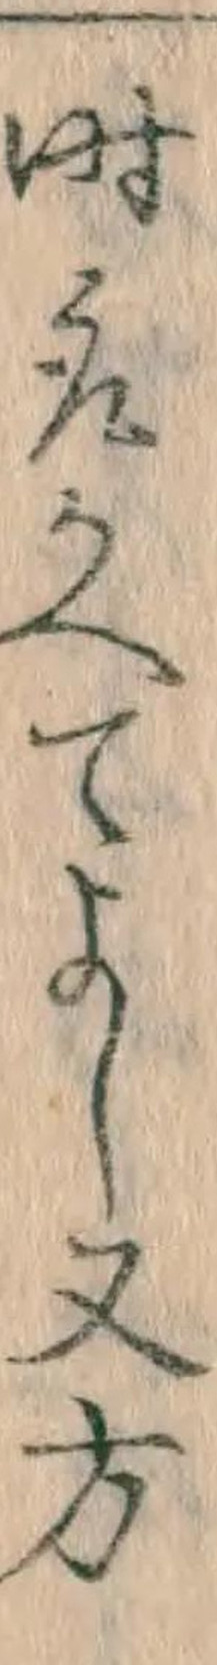時取かへてよし又方
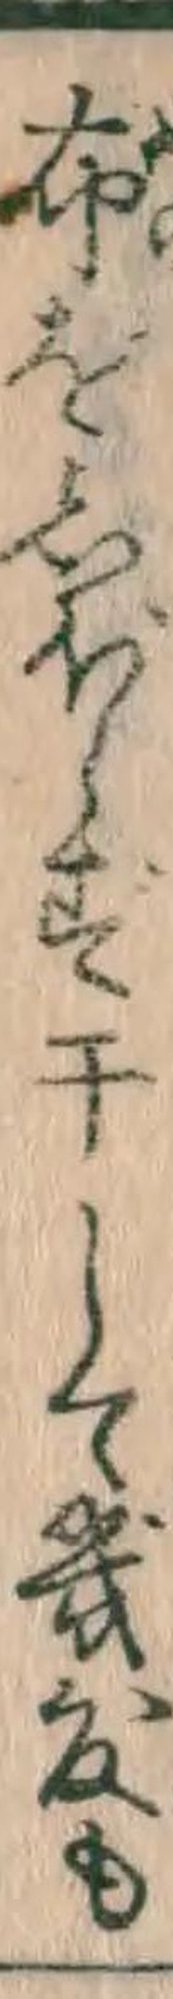布をしぼらず干して幾度も
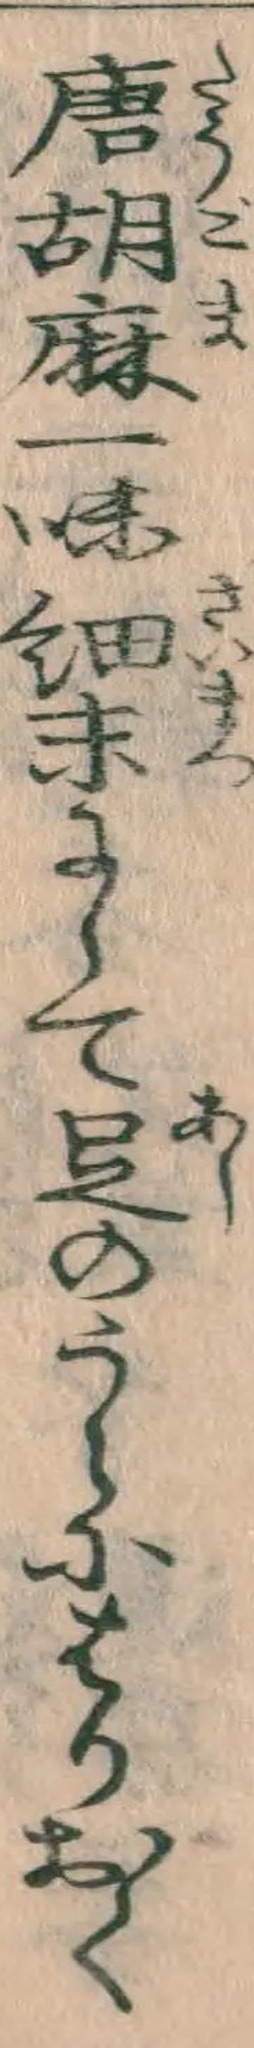唐胡麻一味細末にして足のうらにはりおく
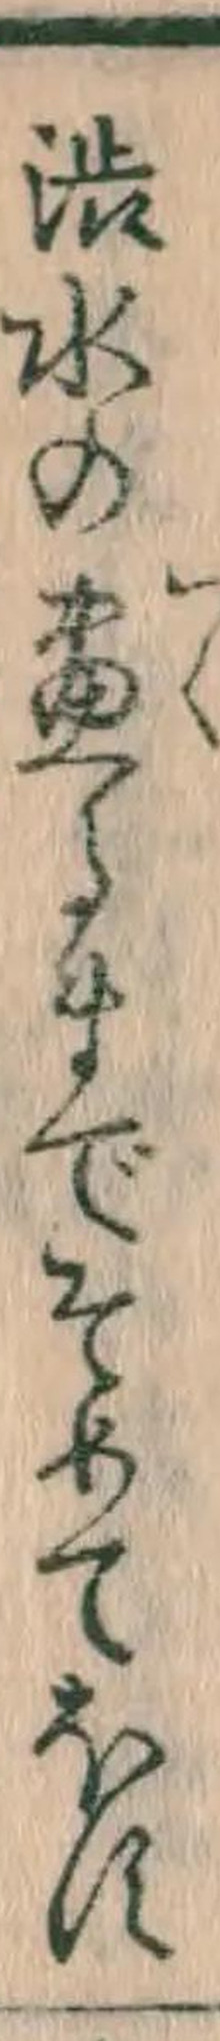渋水の盡るまでそめてほす
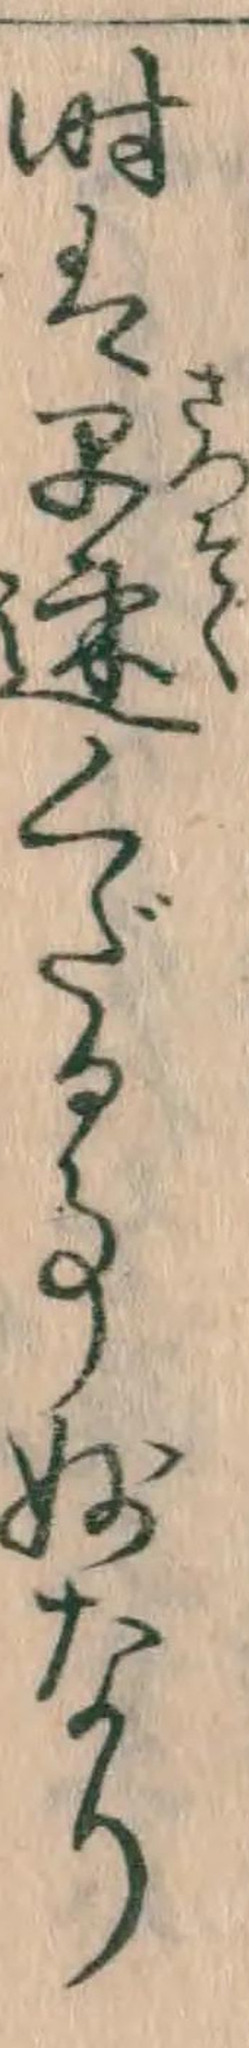時は早速くだる事妙なり
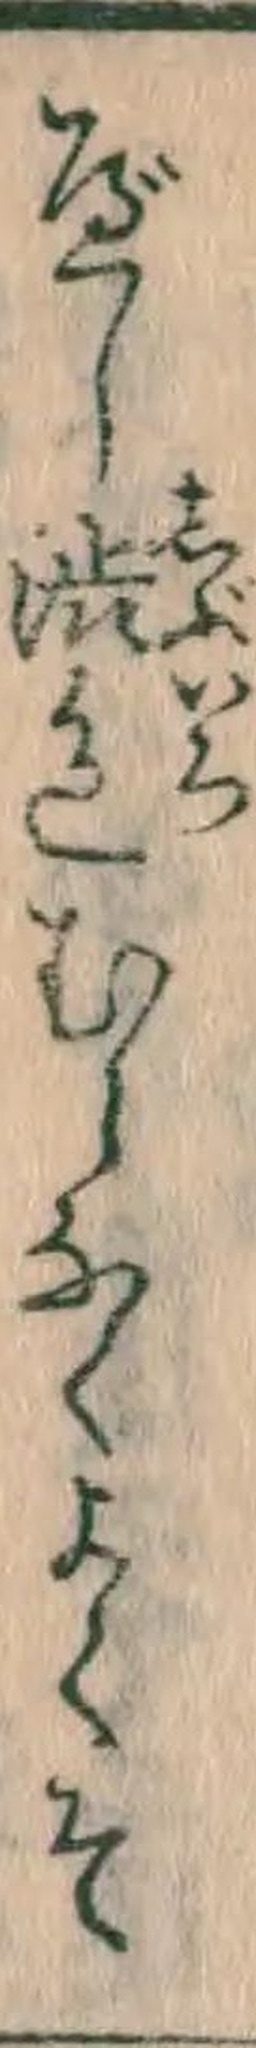べし渋色むらなくよくそ
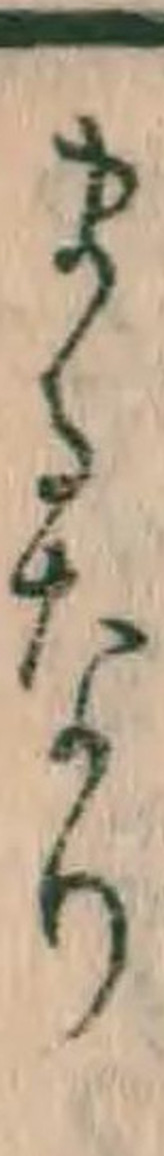まるなり
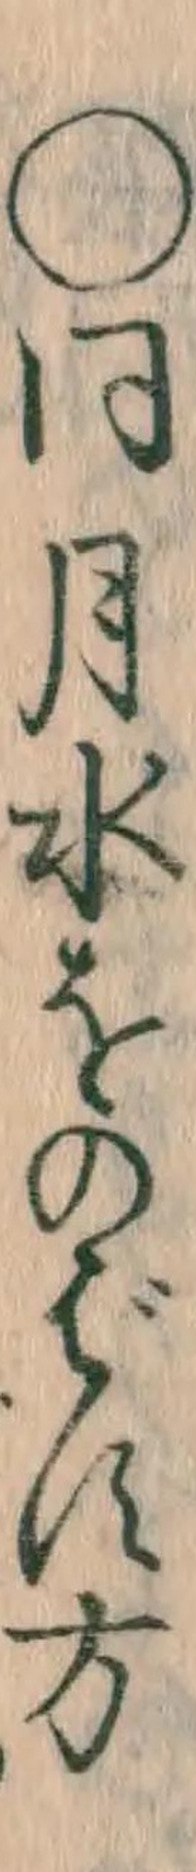○同月水をのばす方
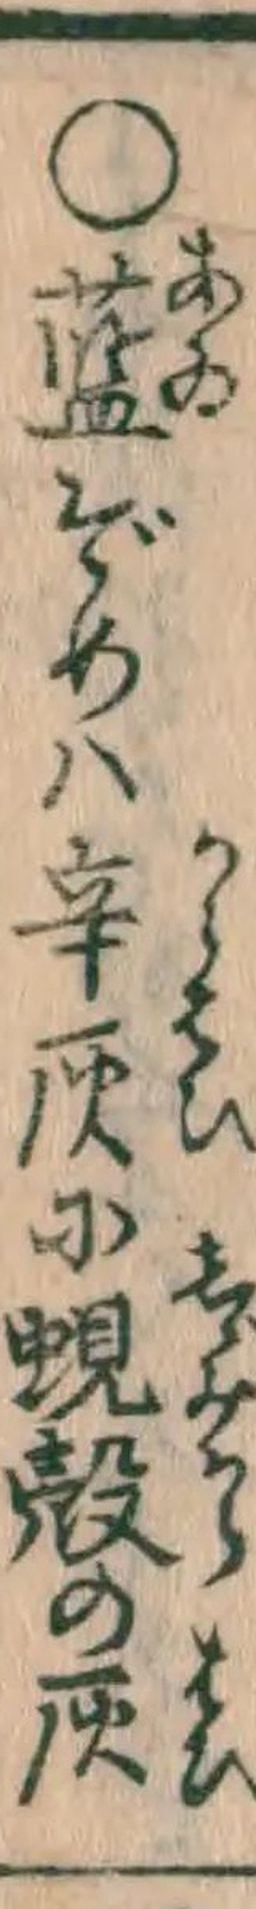○藍ぞめは辛灰に蜆殻の灰
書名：広益秘事大全 3巻. [3]
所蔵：国立国会図書館 National Diet Library, JAPAN
